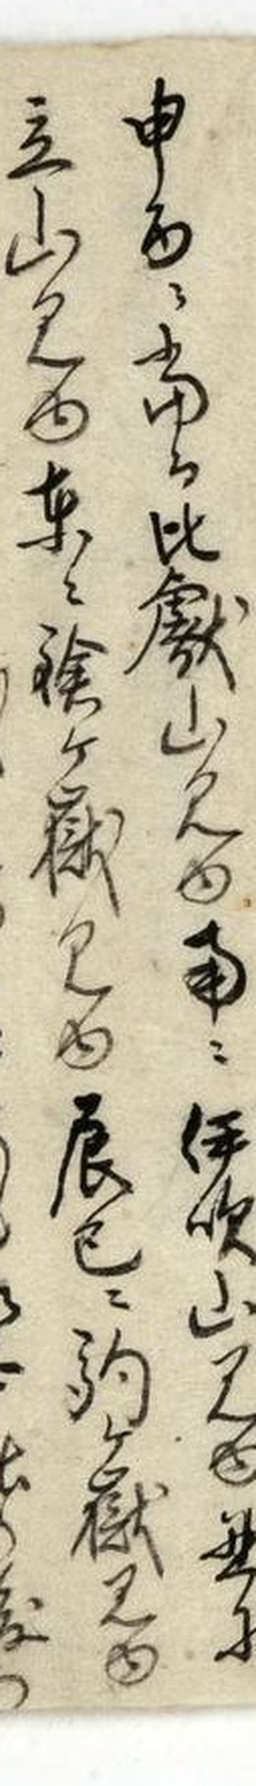立山見ゆ東に鎗ヶ嶽見ゆ辰巳ニ駒ヶ岳見ゆ
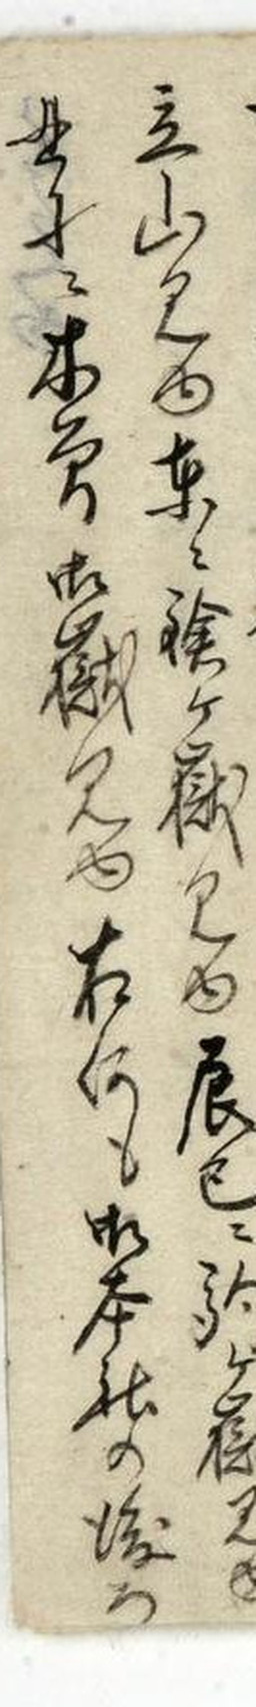北寅に木曽御嶽見ゆ在何も御本體の後ろ

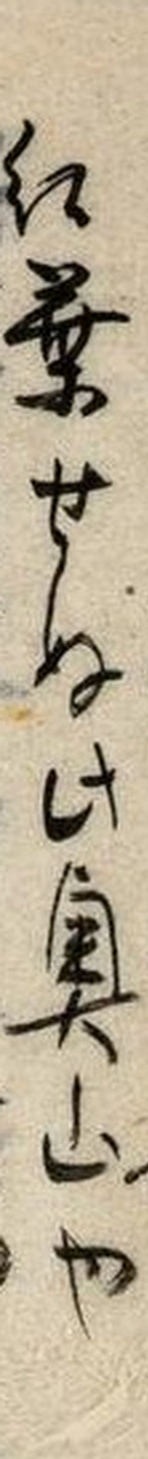紅葉せぬ此奥山や
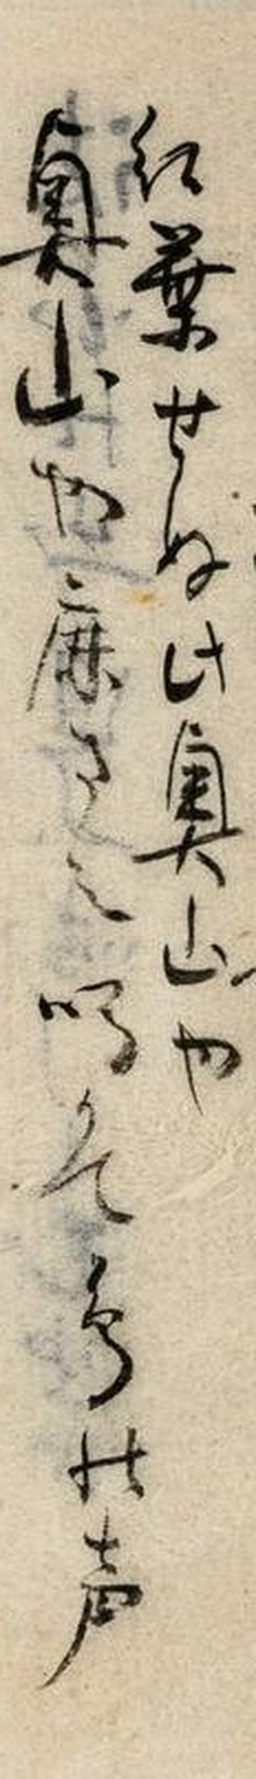奥山やさ之鳴かて鳥の声
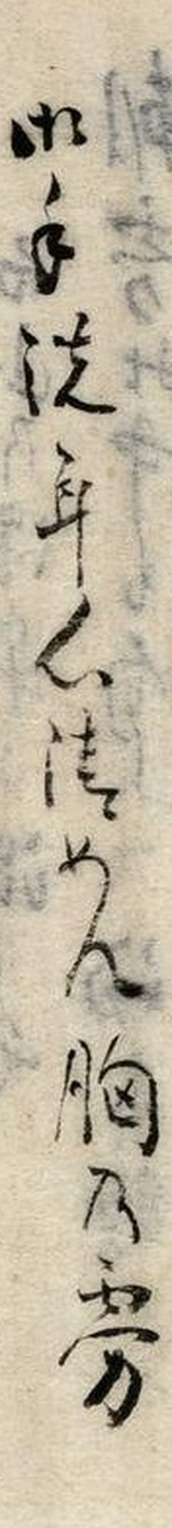御手洗耳心清めん胸乃
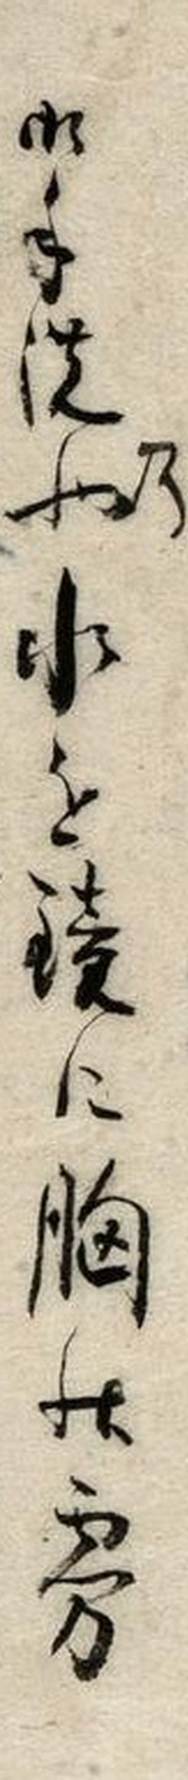御手洗乃水を鏡に胸の

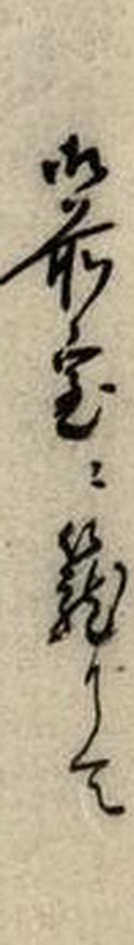御前室ニ籠りて
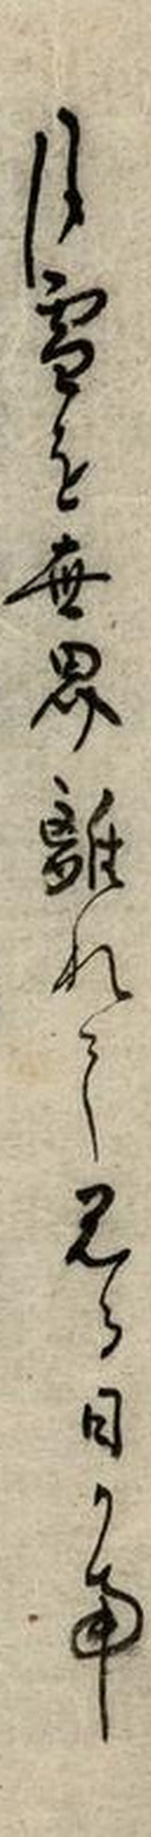月雪を世界離れて見る日か南
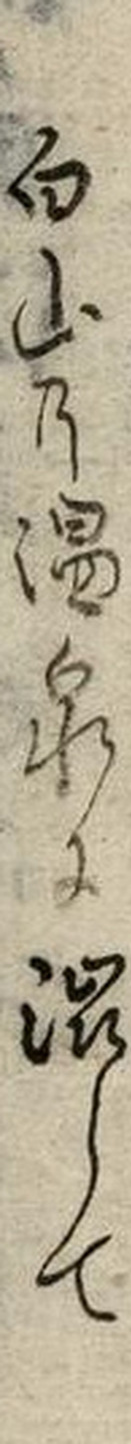白山乃温泉に温りて
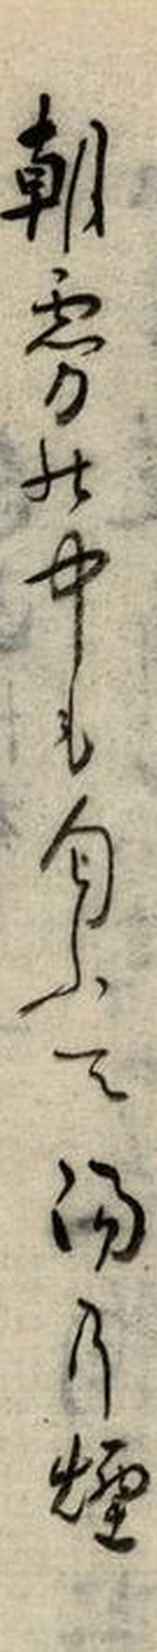朝の中も匂ふて湯乃煙
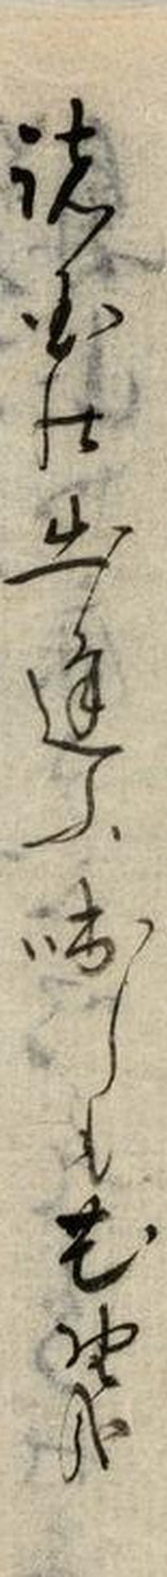諸国の出逢ふしも花野哉

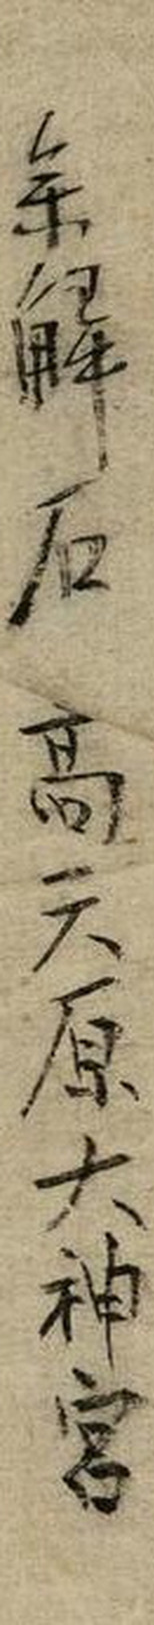参解石高天原大神宮
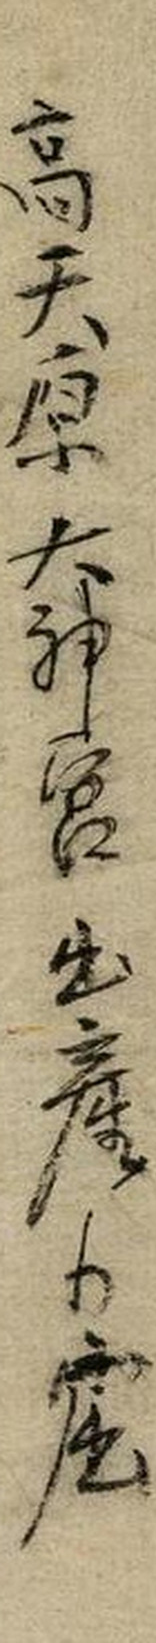高天原大神宮出産の窟
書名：白山道中名所筆記（旅日記）
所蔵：福井県文書館 Fukui Prefectural Archives
